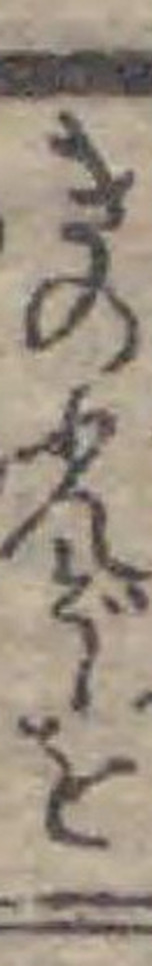きのふんどしを
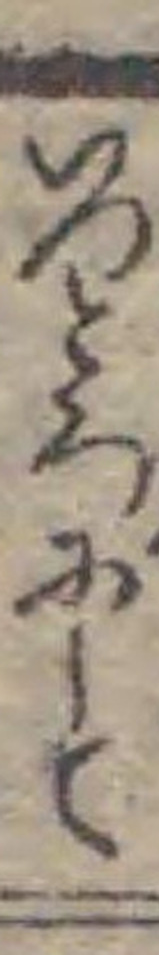いつとろ？にして
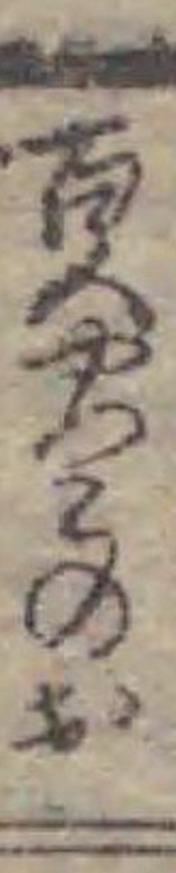百人のやつこのお
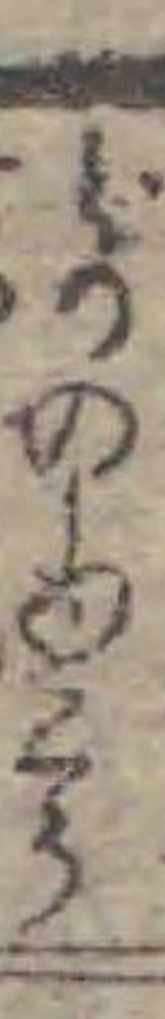どりのしゆこう
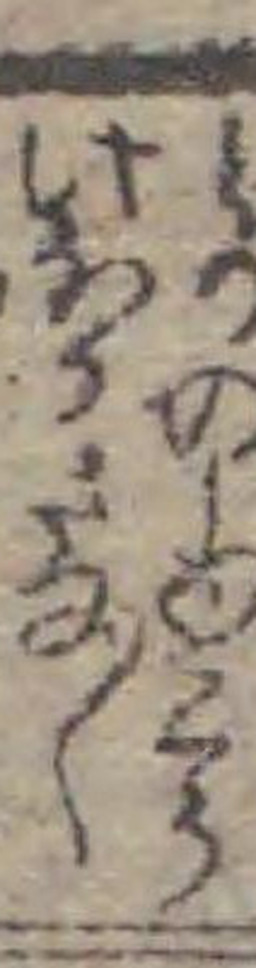此ほかさま〳〵
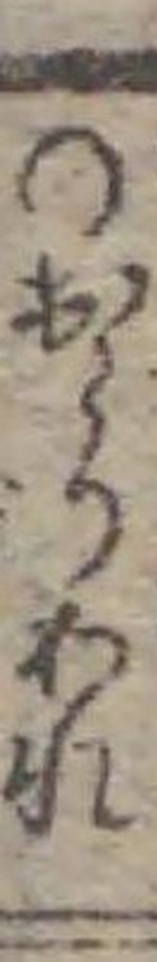のおこりあれ
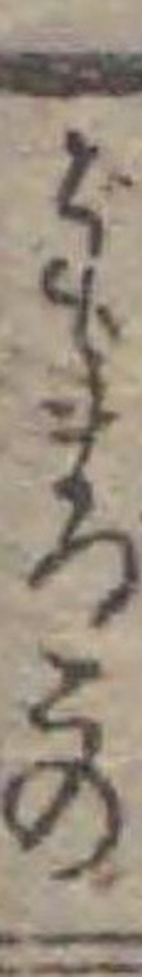どもまづこの
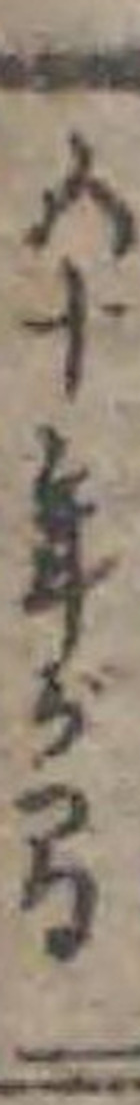五十年が間
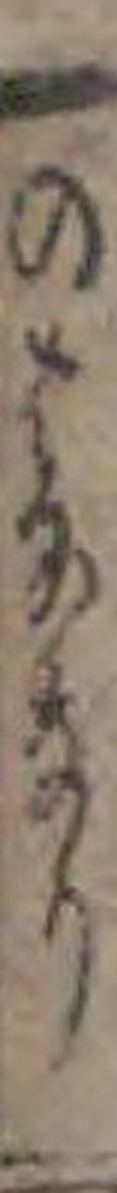のはななり
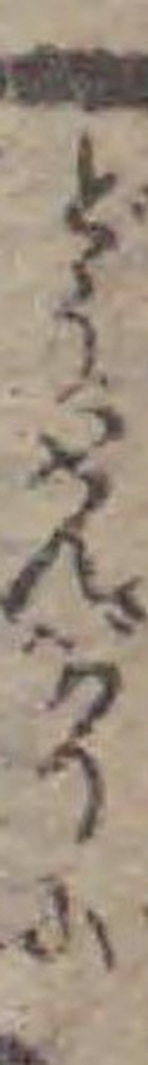どうとんぼりに
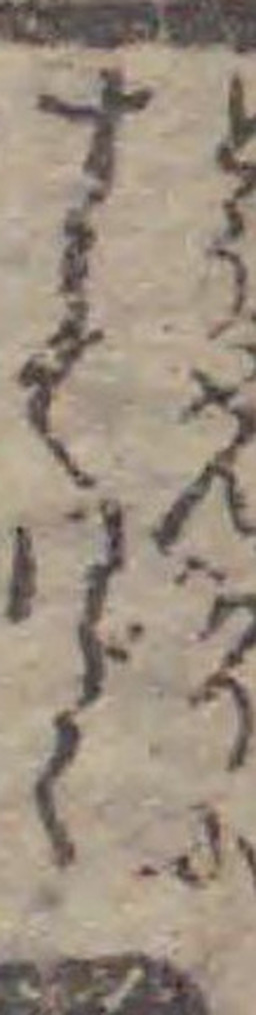すみて同じく
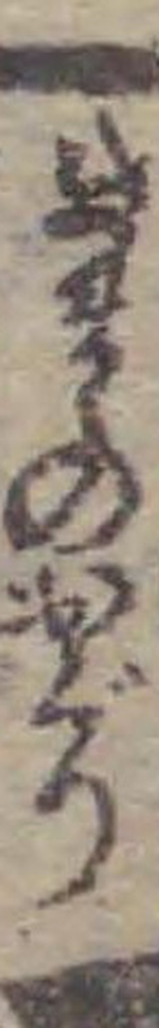きまゝのおごり
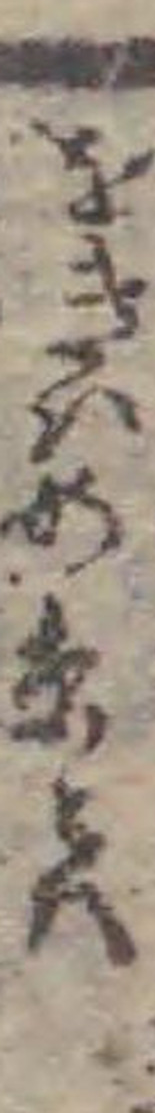をきはめ京とは
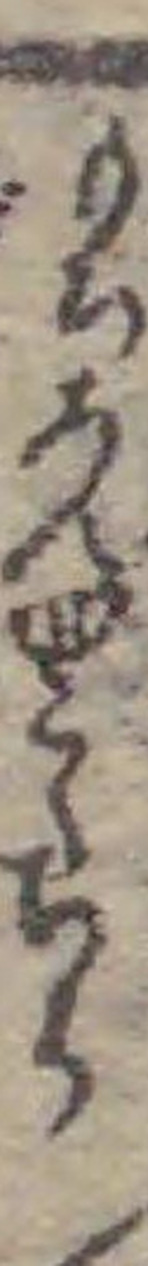もちろん四こくちう
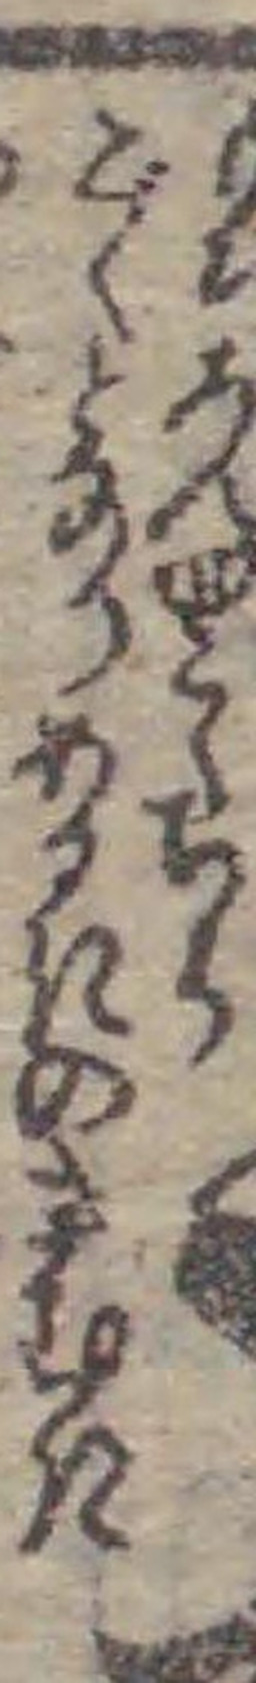ごくとなりあるきのきむき
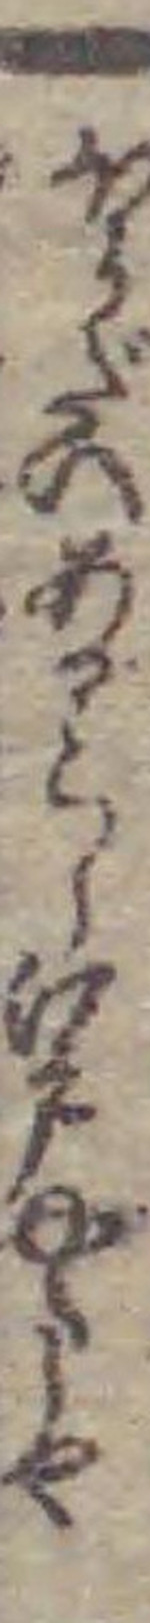ほうだいあるとし江戸やくしや
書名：見徳一炊夢 : 3巻
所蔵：国立国会図書館 National Diet Library, JAPAN
